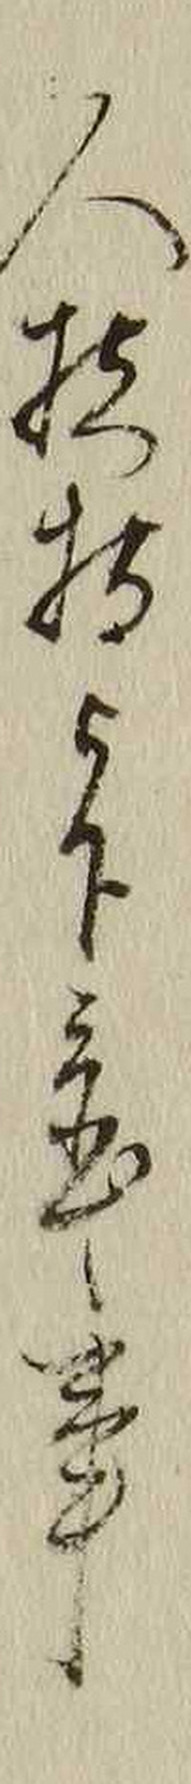人扶持被下置候事
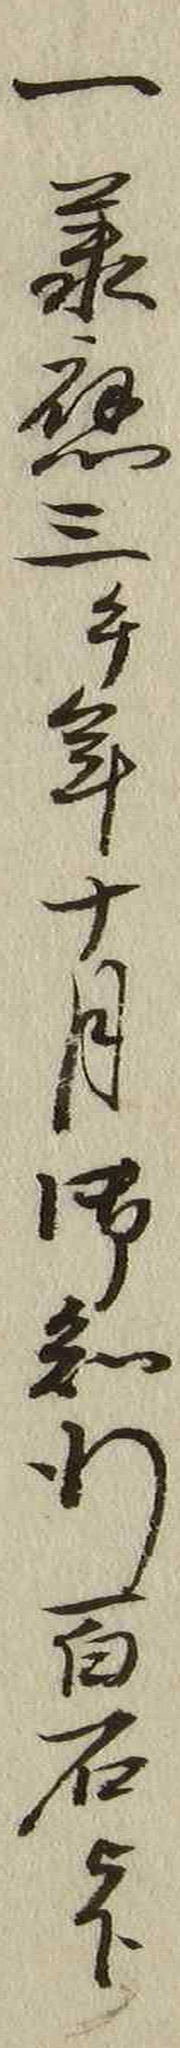一承応三午年十月御知行百石被下
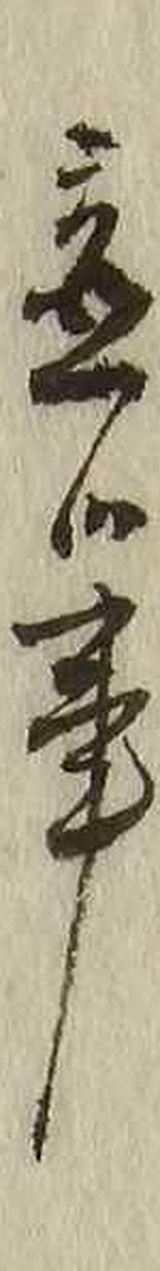置候事
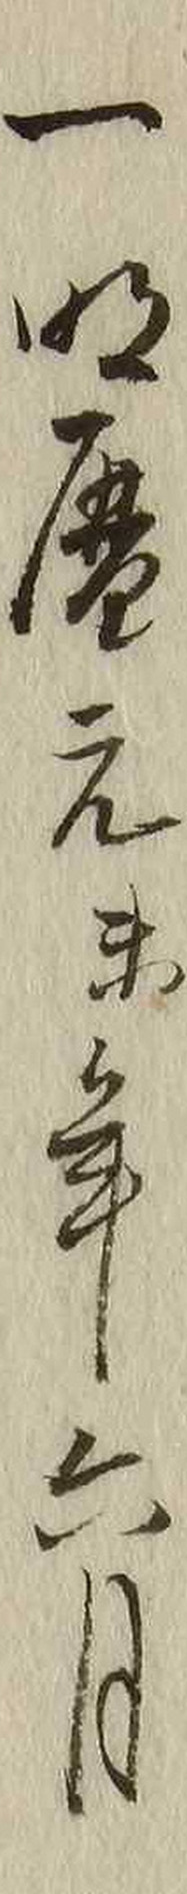一明暦元未年六月
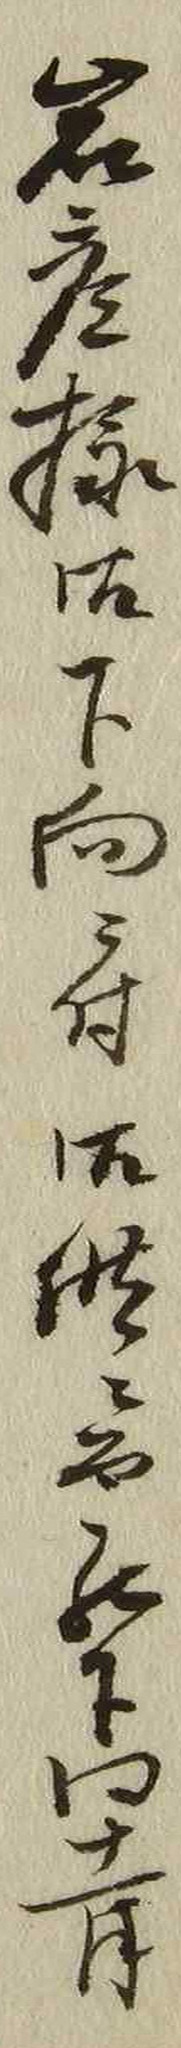岩彦様御下向ニ付御供ニ而罷下同十一月
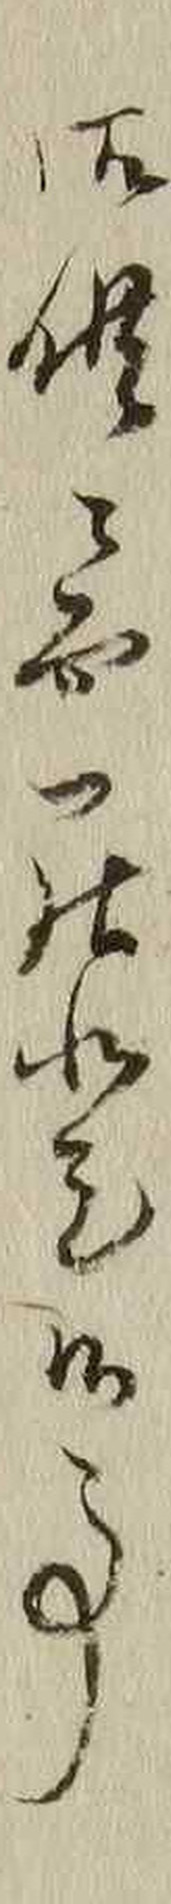御供ニ而罷登候事
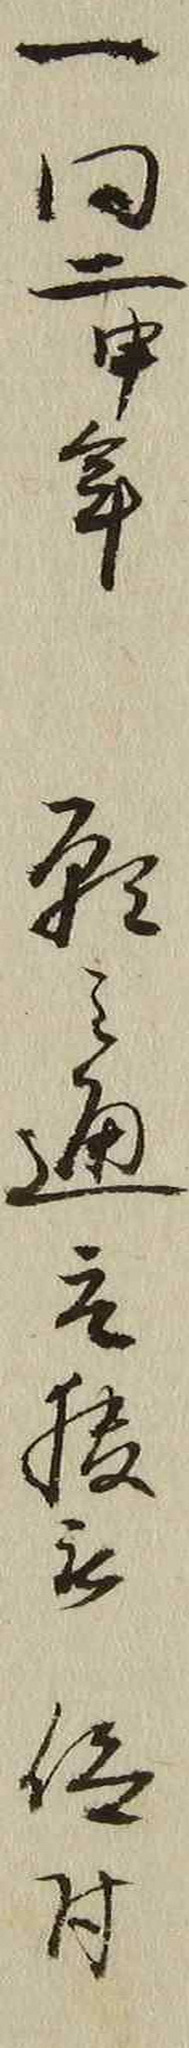一同二申年願之通元服被仰付
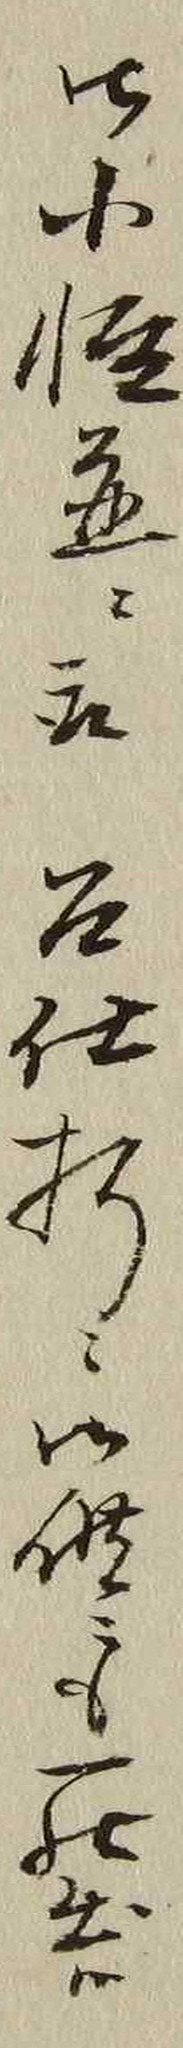御小性並ニ被召仕折々御供ニも罷出候
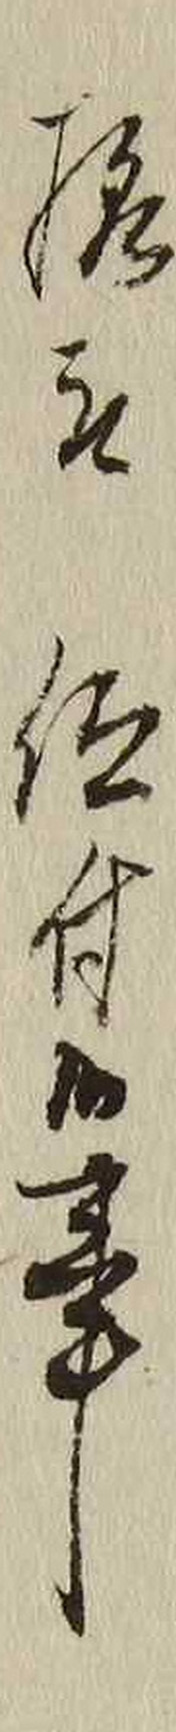様被仰付候事
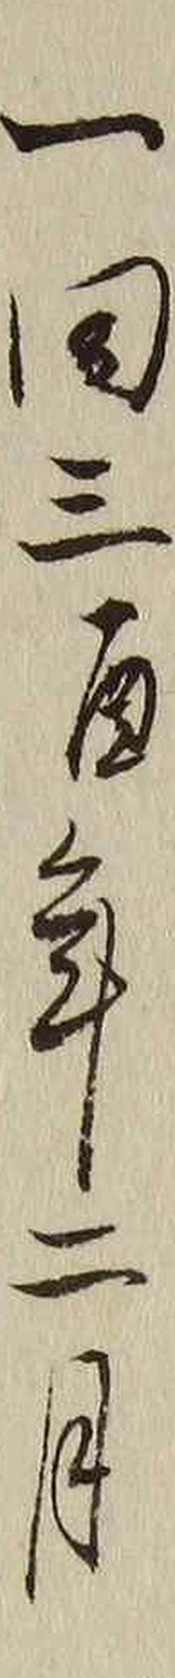一同三酉年二月
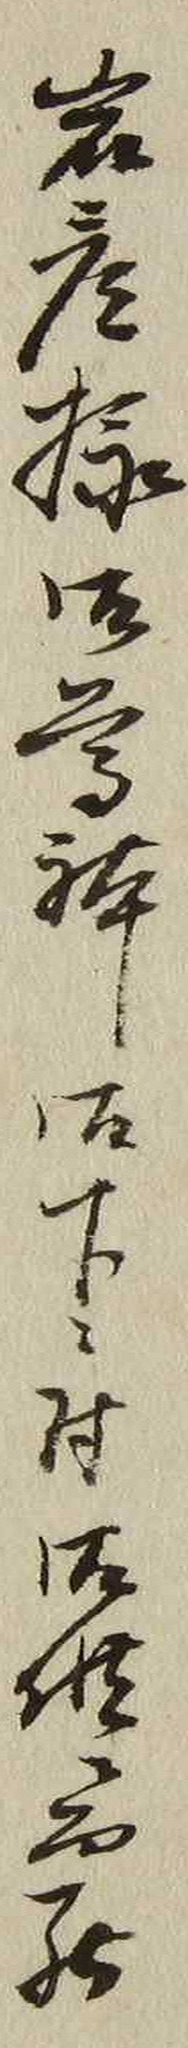岩彦様御尊体御下ニ付御供ニ而罷
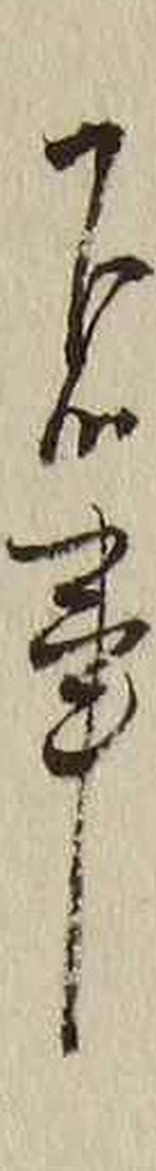下候事
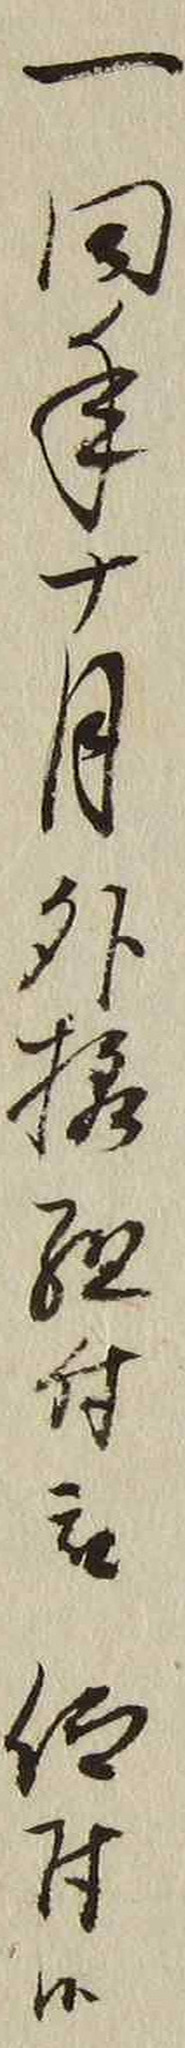一同年十月外様組付被仰付候
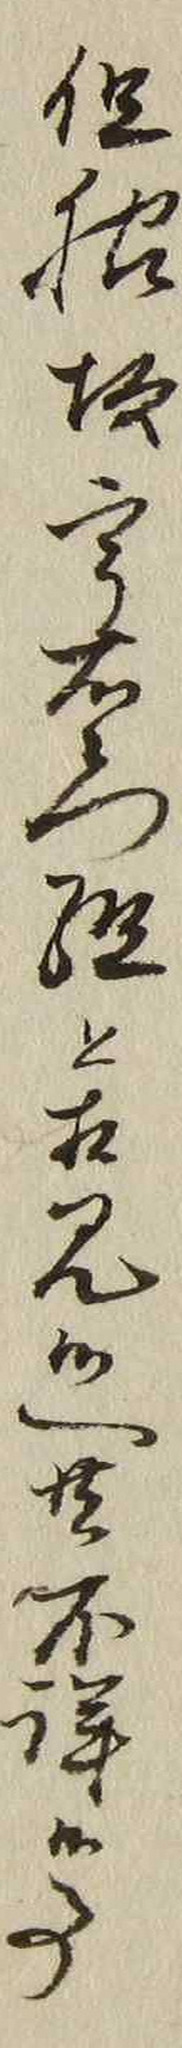但脇坂宇右衛門組と右見候へ共不詳候事
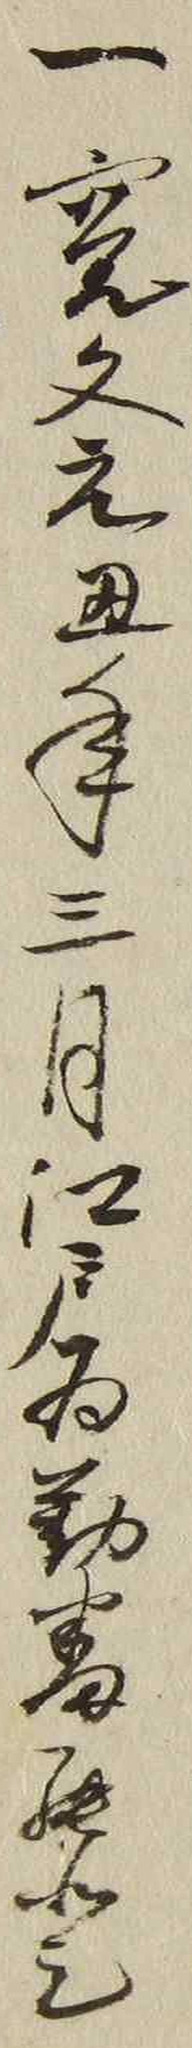一寛文元丑年三月江戸為勤番罷登
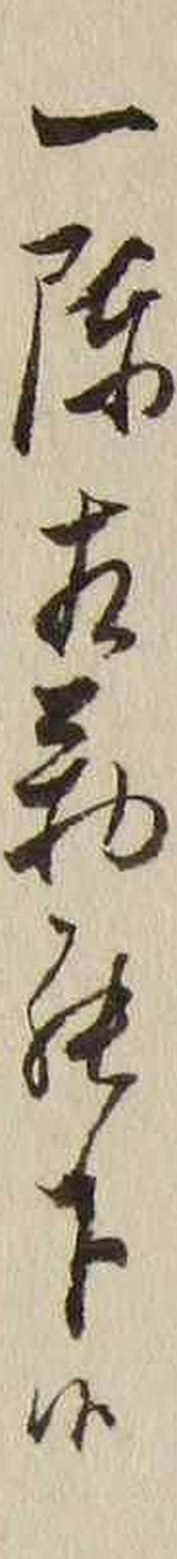一陣相勤罷下候
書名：諸士系譜　巻之359　す之部9
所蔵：会津若松市立会津図書館
